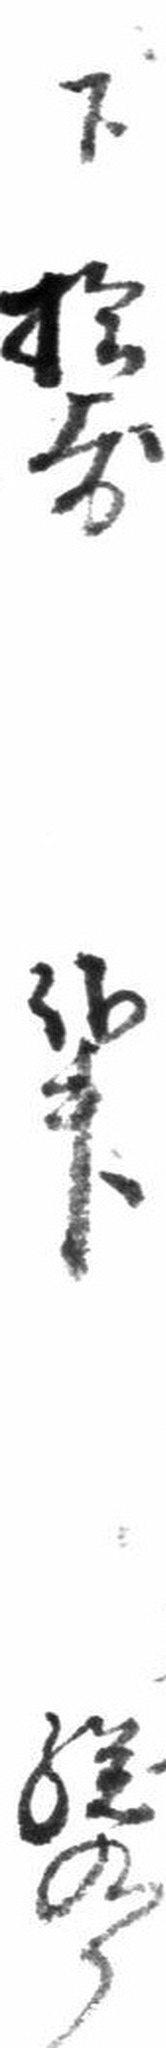下拾歩弐升孫九郎
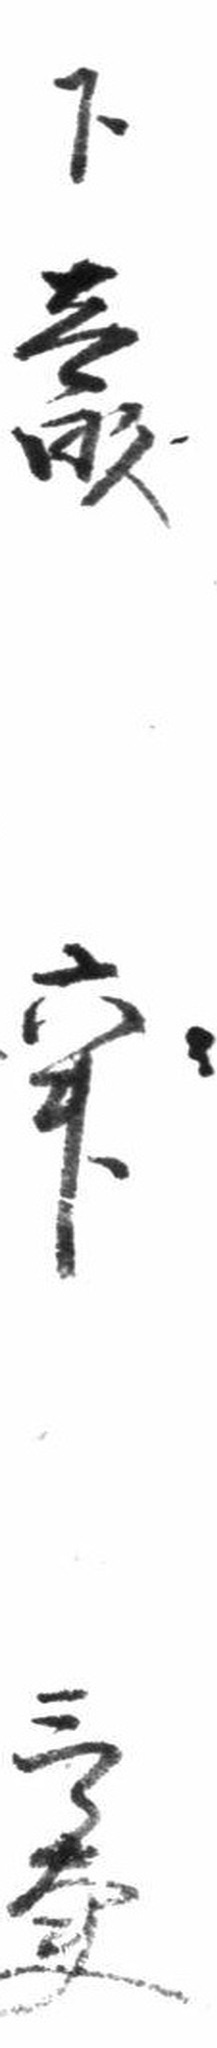下壱畝六升三郎大夫
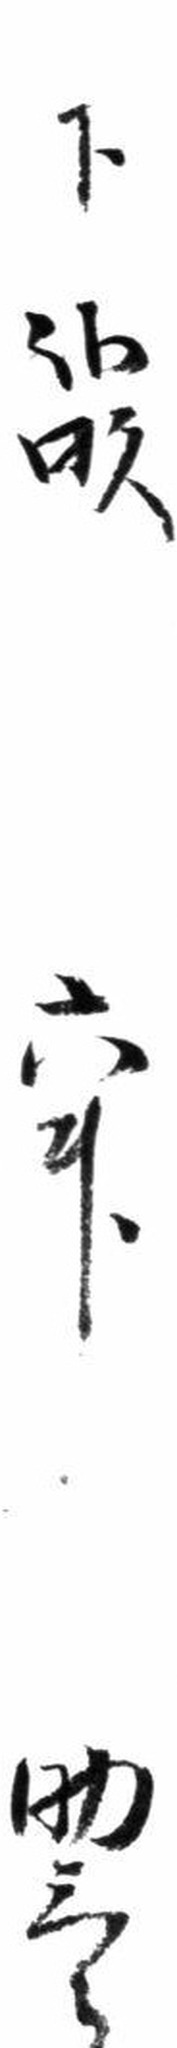下弐畝六升助三郎
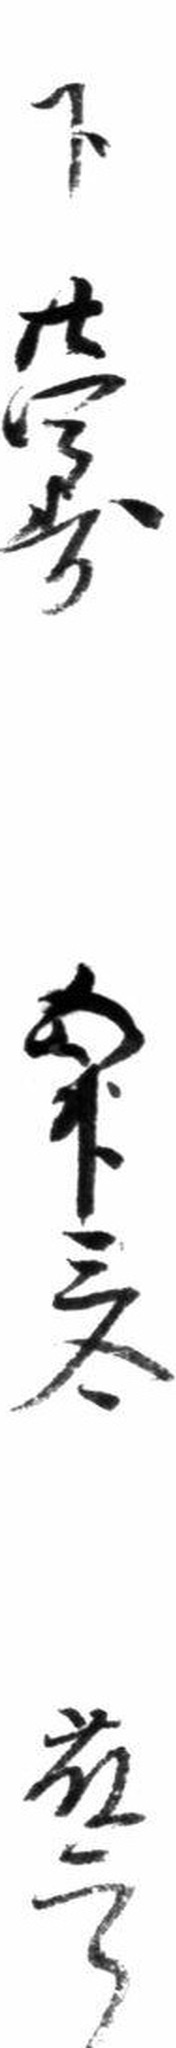下廿四歩五升三合藤二郎
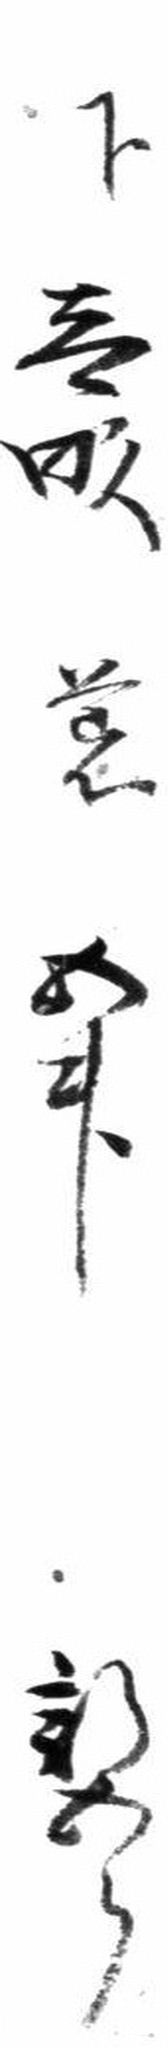下壱畝荒五升新五郎
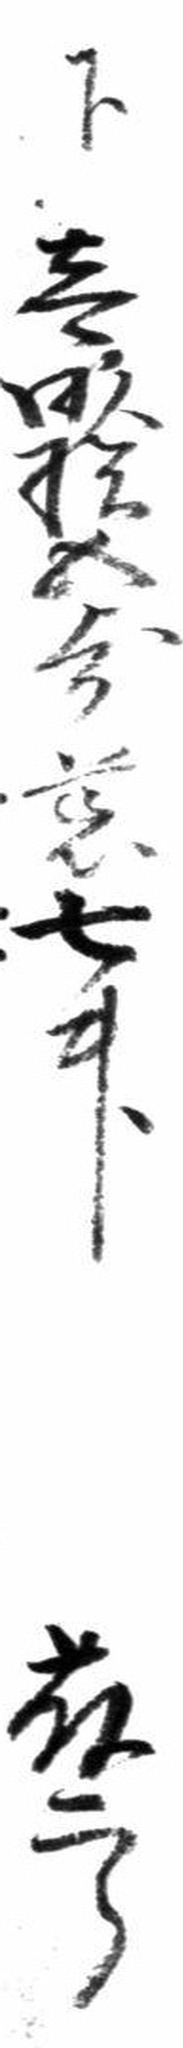下壱畝拾五歩荒七升藤二郎

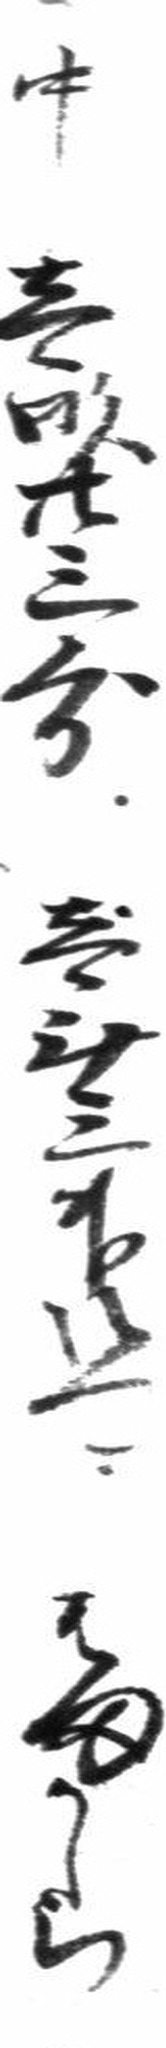中壱畝廿三歩壱斗三升八合はまかしら
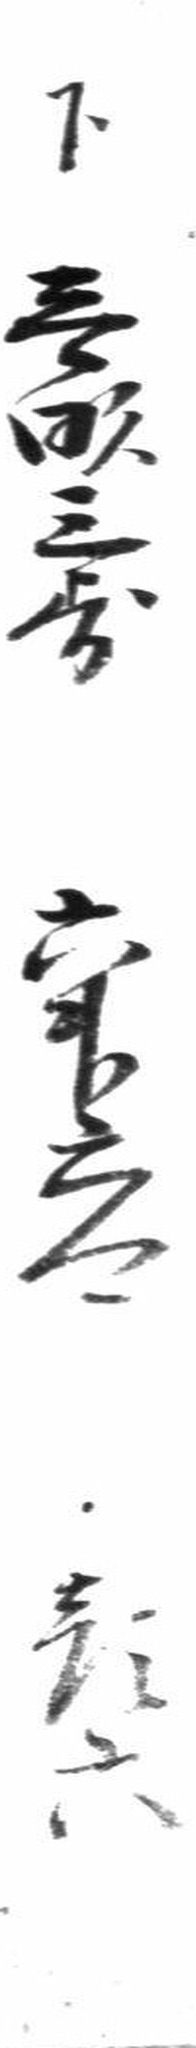下壱畝三歩六升六合彦六
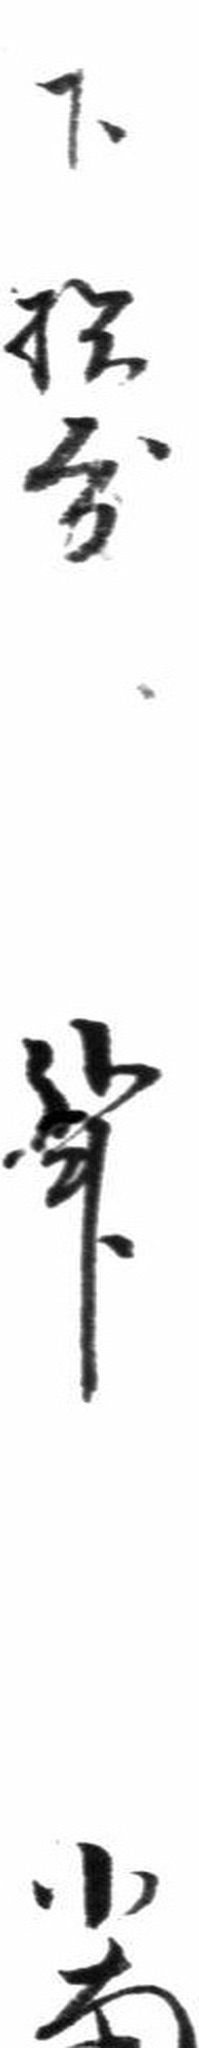下拾歩弐升小南
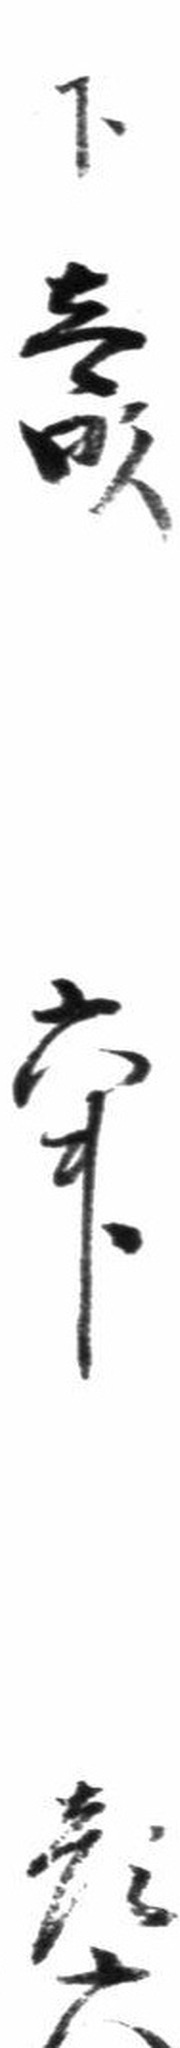下壱畝六升彦六
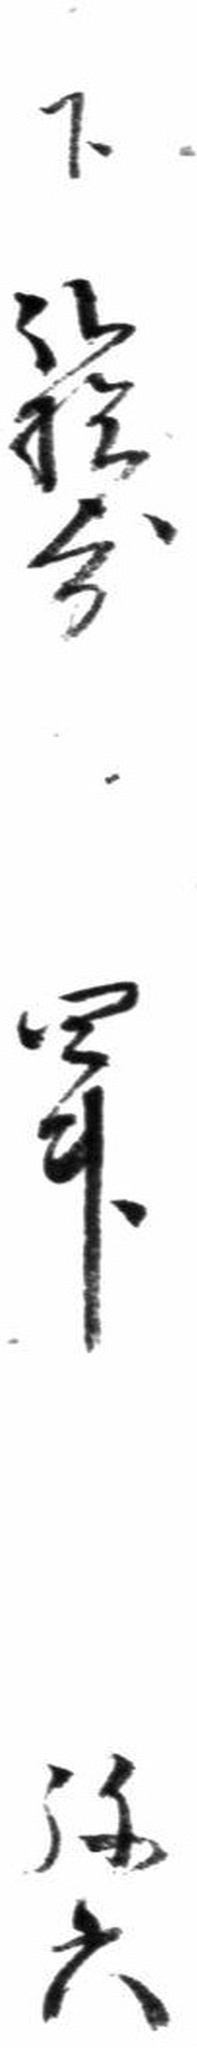下弐拾歩四升弥六
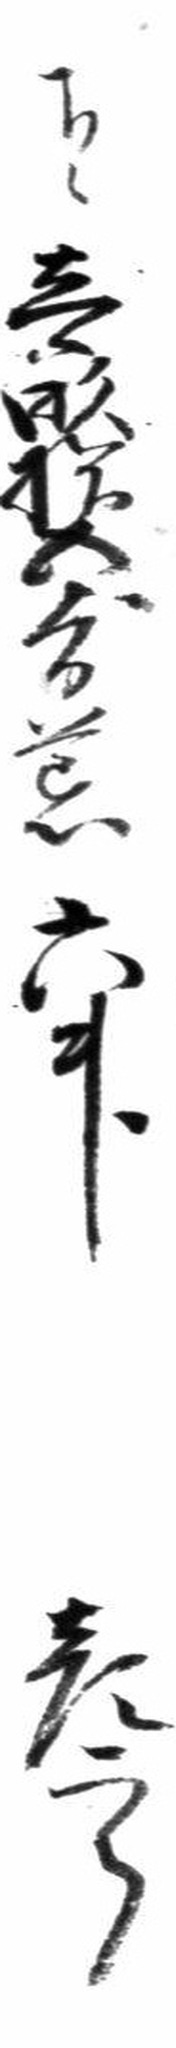下々壱畝拾五歩荒六升彦二郎
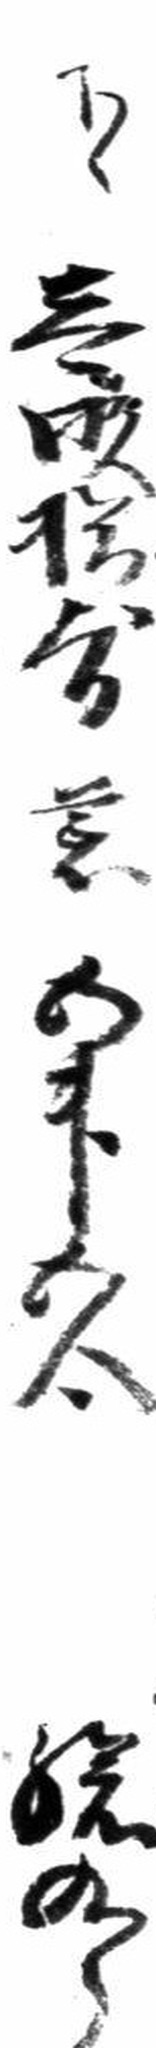下々壱畝拾歩荒五升五歩孫九郎
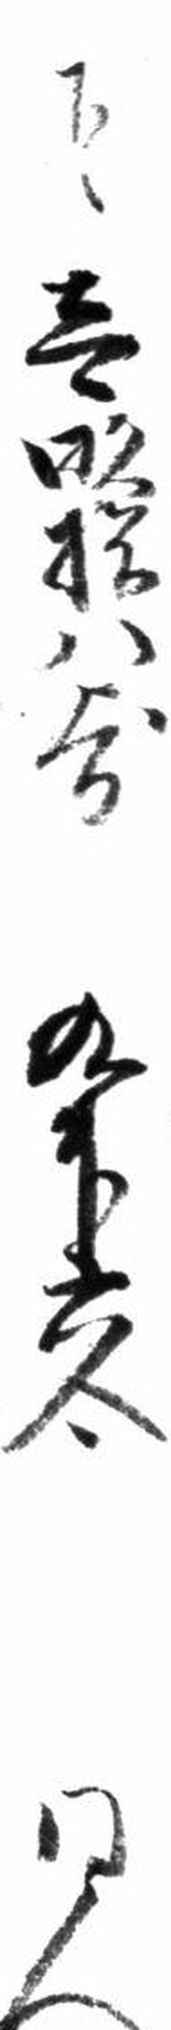下々壱畝拾八歩九升六合同人
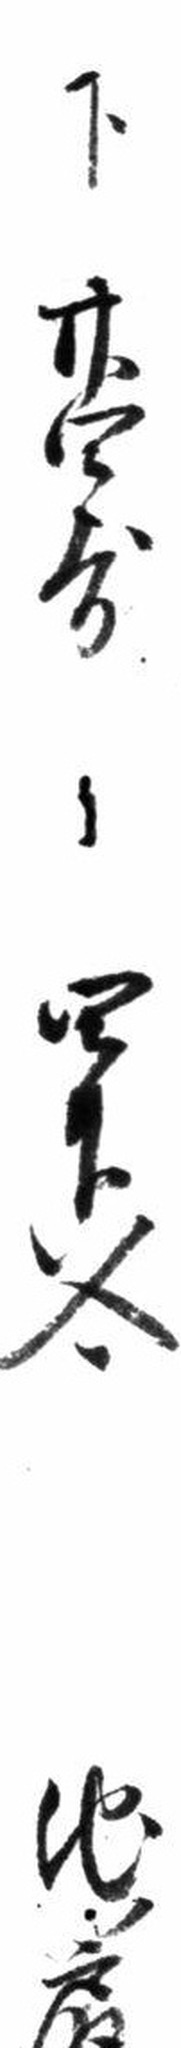下廿四歩四升八合池ノ尻
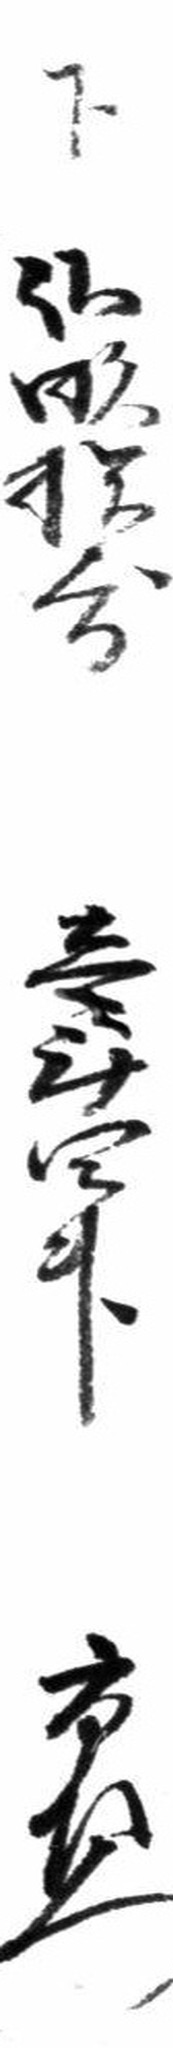下弐畝拾歩壱斗四升市左衛門
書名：若州三方郡之内世久見浦御検地帳（世久見浦検地帳写）
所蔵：福井県文書館 Fukui Prefectural Archives
